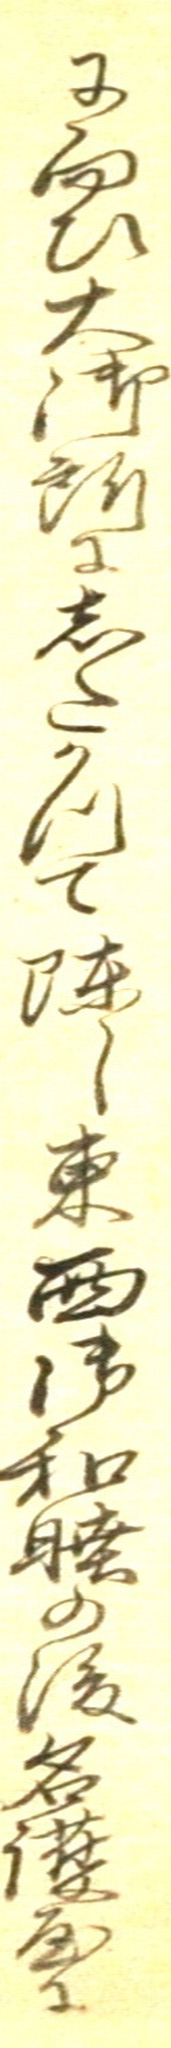に向ひ大御所にしたかつて陣し東西御和睦の後名護屋に
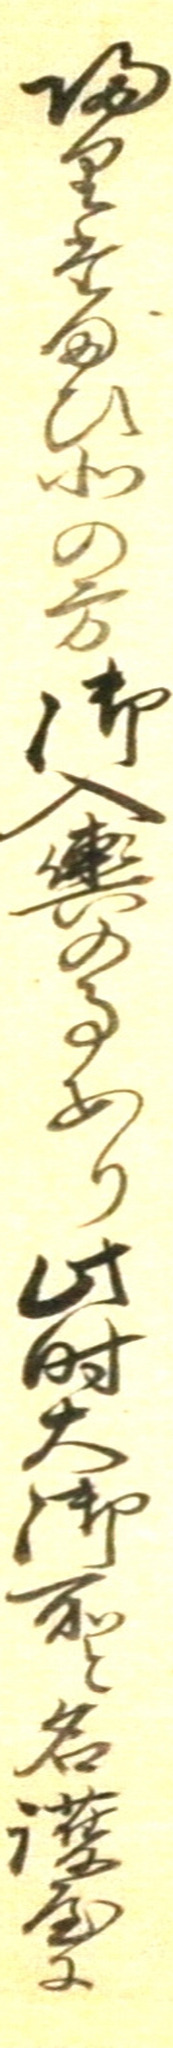帰りたまひ北の方御入輿の事あり此時大御所と名護屋に
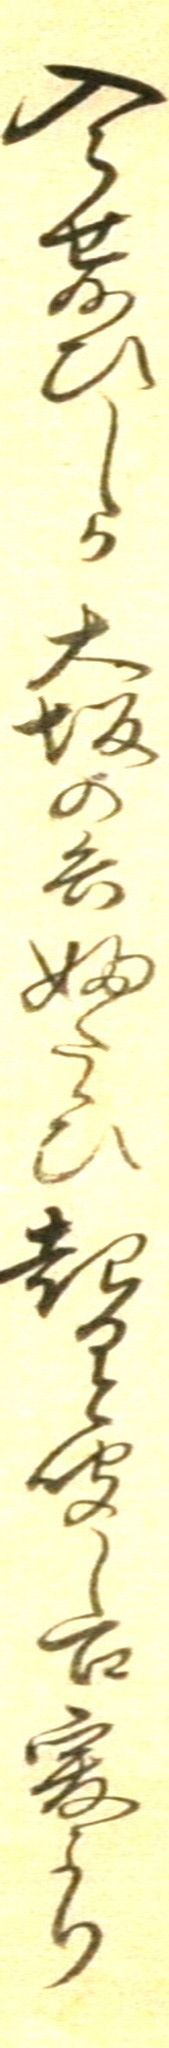入らせ給ひしか大坂の兵ふたゝひ起ると聞し召爰より
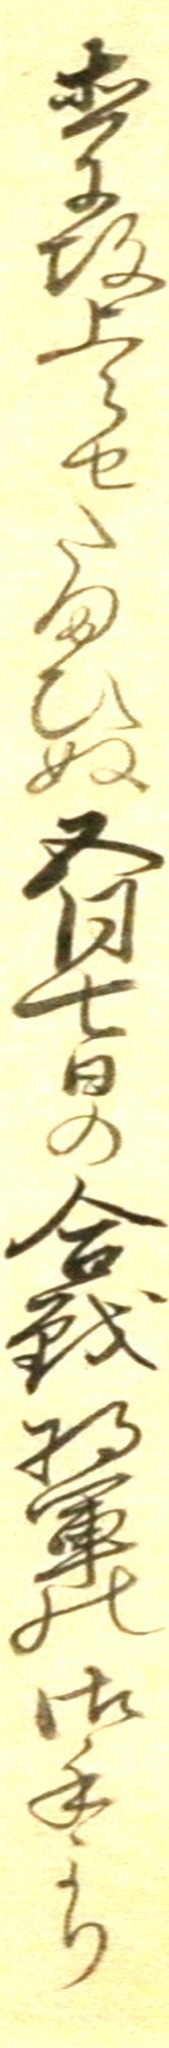直に攻上らせたまひぬ五月七日の合戦将軍の御手より
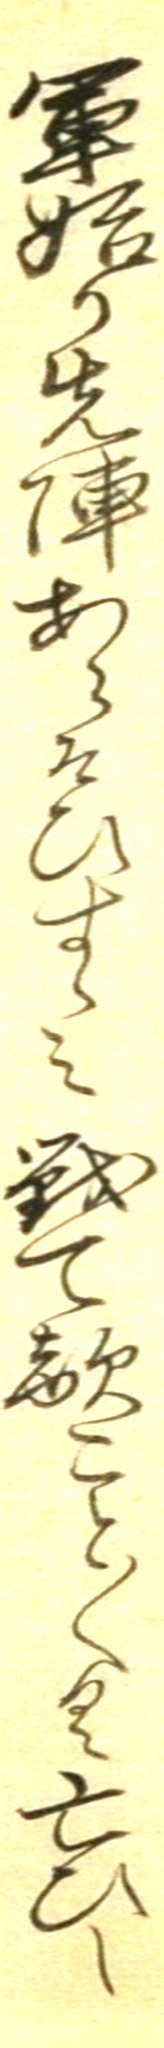軍始り先陣あらそひすゝみ戦て敵こと〳〵く亡ひし
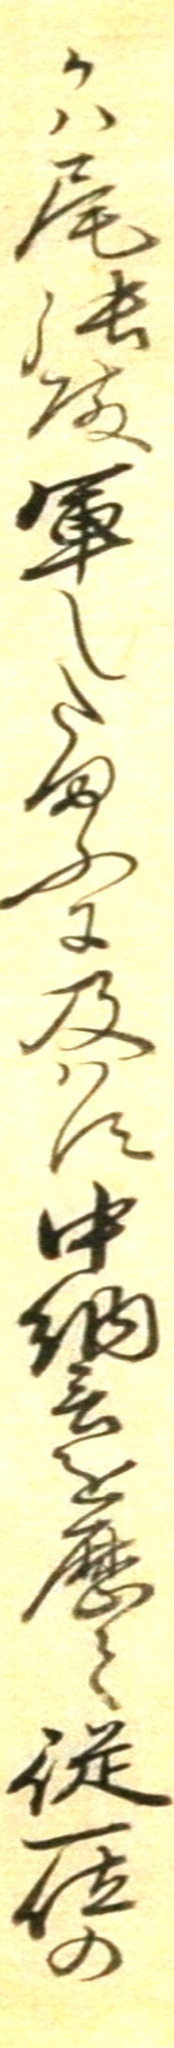かは尾張殿軍したまふに及はす中納言を歴て従一位の
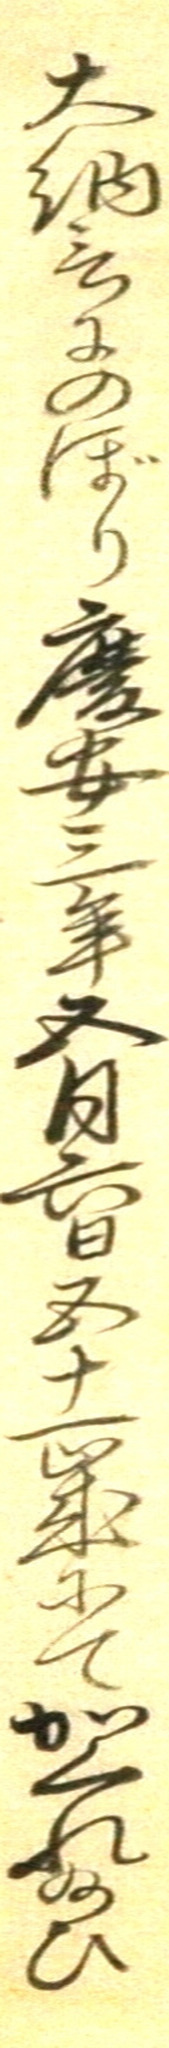大納言にのぼり慶安三年五月六日五十一歳にてかくれ給ひ
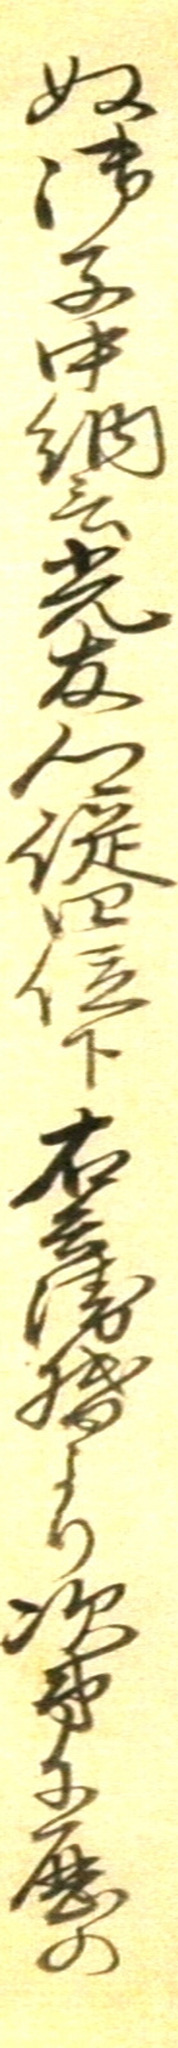ぬ御子中納言光友卿従四位下右兵衛督より次第に歴の
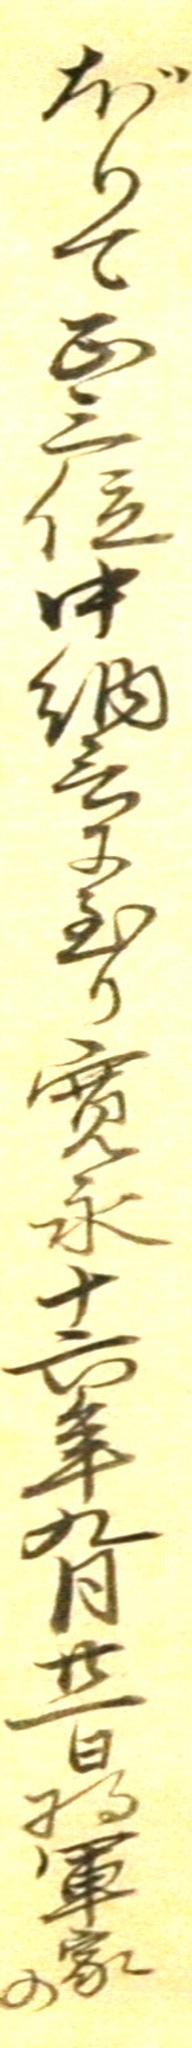ぼりて正三位中納言に至り寛永十六年九月廿一日将軍家の

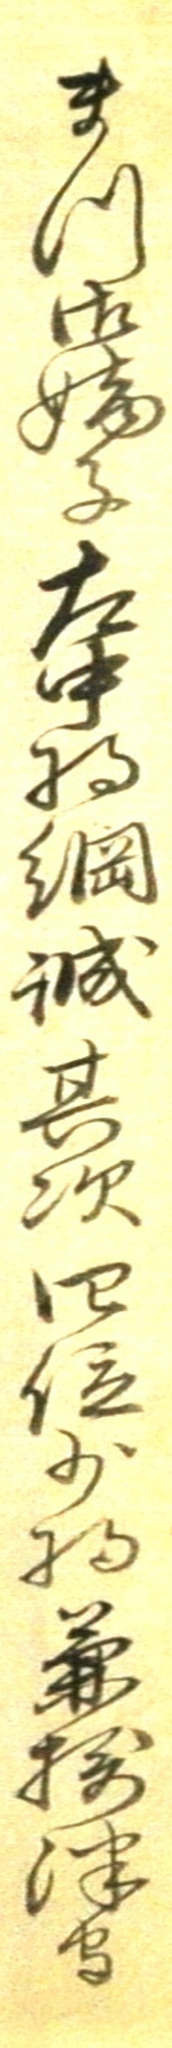まつ御嫡子左中将綱誠其次四位少将兼摂津守
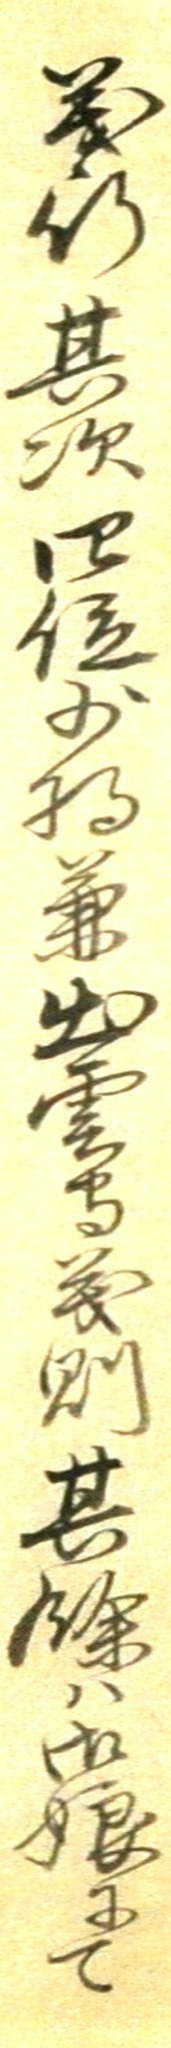義行其次四位少将兼出雲守義則其余は御娘にて
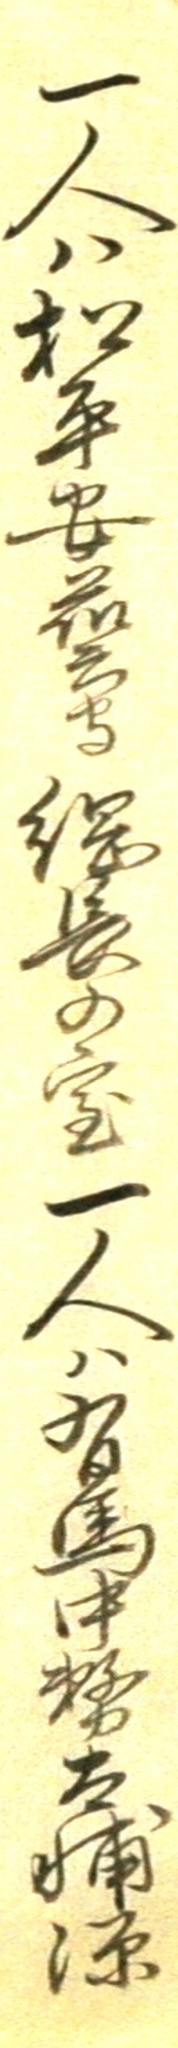一人は松平安芸守綱長の室一人は有馬中務太輔源
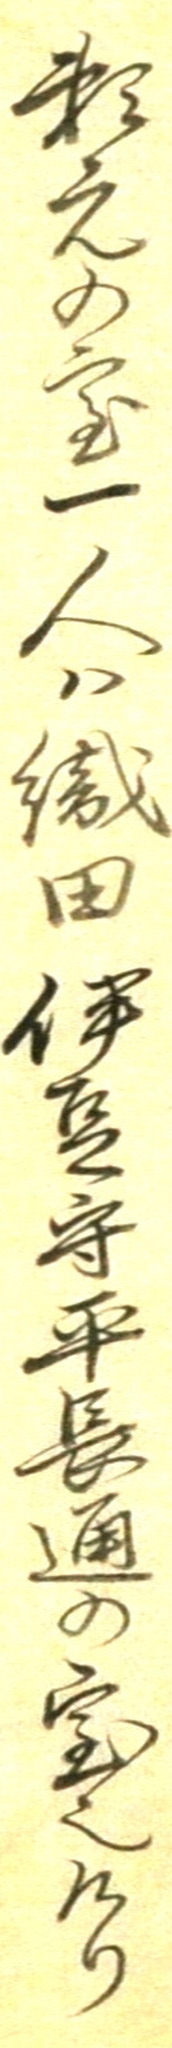頼之の室一人は織田伊豆守平長通の室也けり
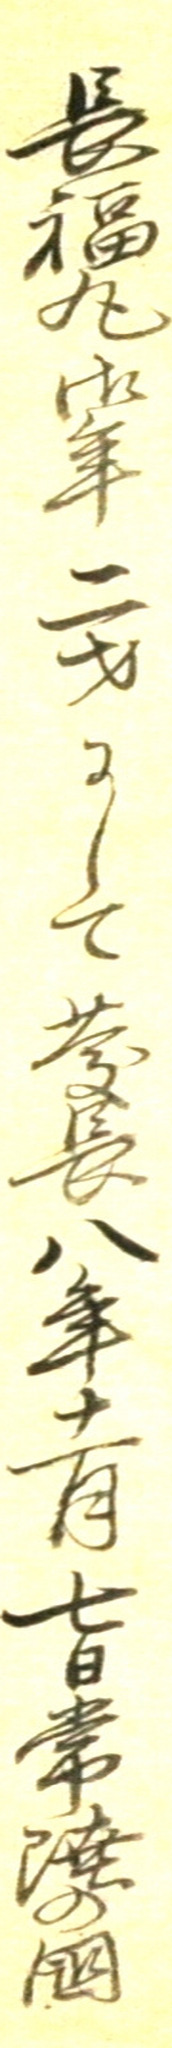長福丸御年二歳にして慶長八年十一月七日常陸の国
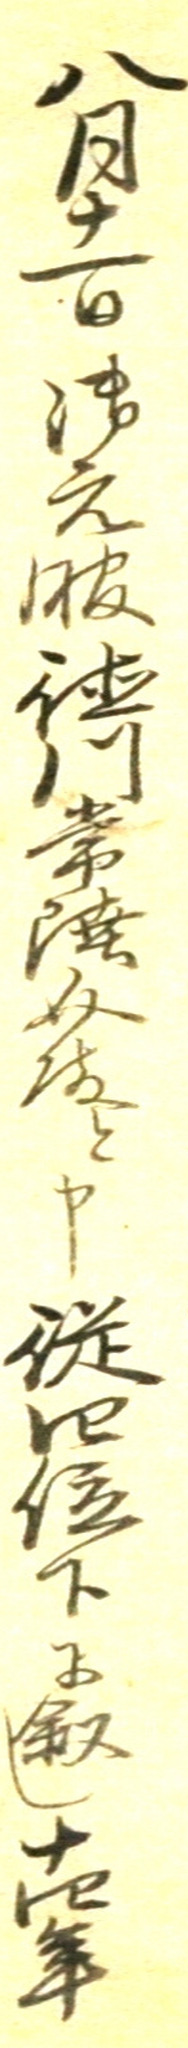八月十一日御元服徳川常陸介殿と申従四位下に叙し十四年
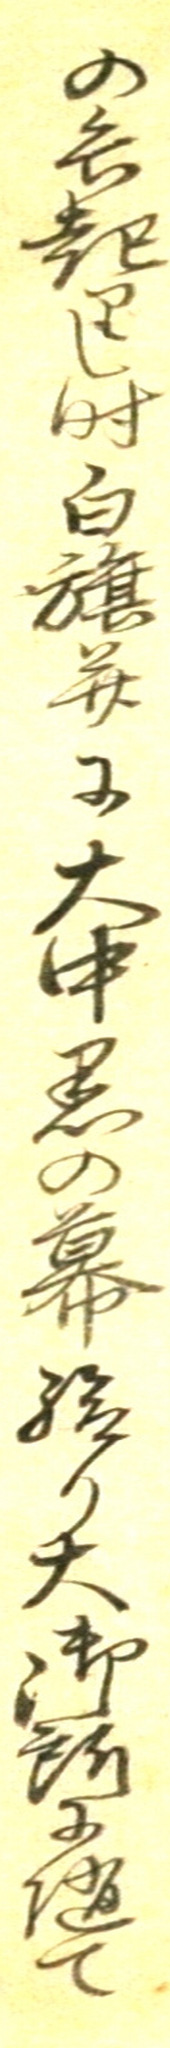の兵起りし時白旗并に大中黒の幕給り大御所に随て
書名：藩翰譜（一）
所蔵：伊那市立高遠町図書館・合同会社AMANE
